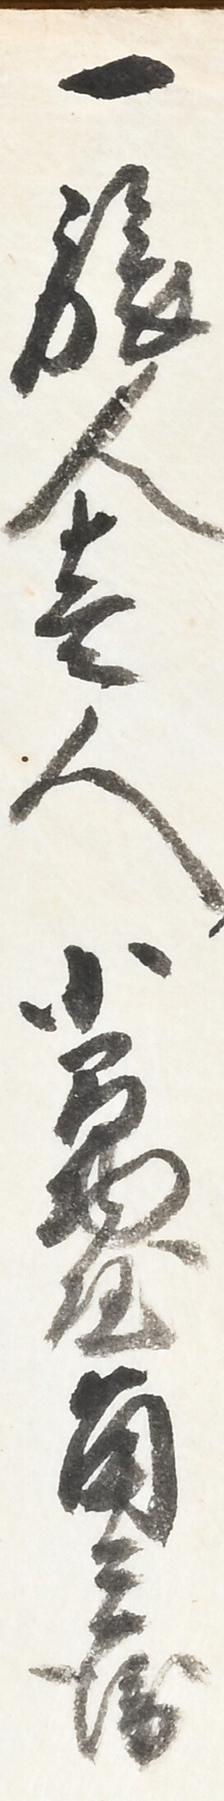一旅人壱人高砂屋嘉兵衛
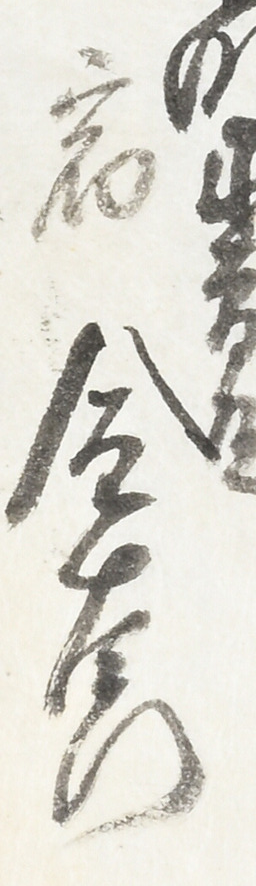宿金右衛門
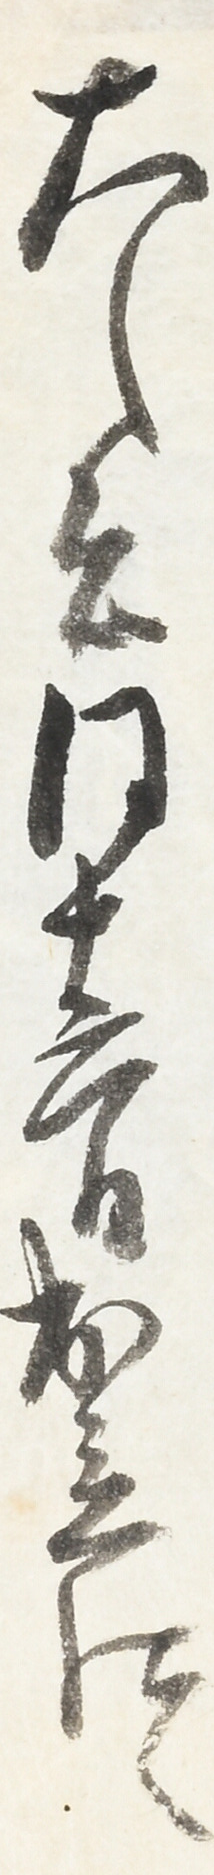右之者同十六日出立仕候

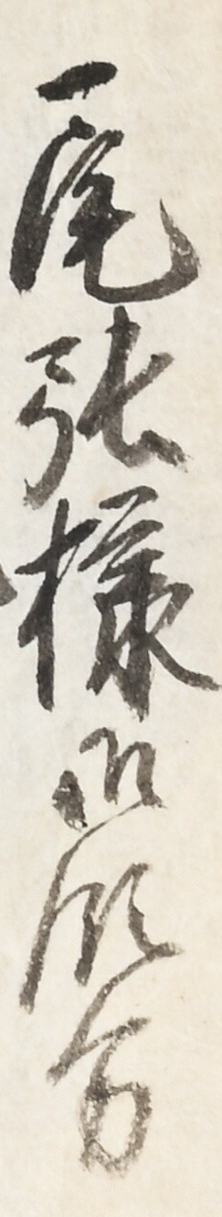尾張様御領分
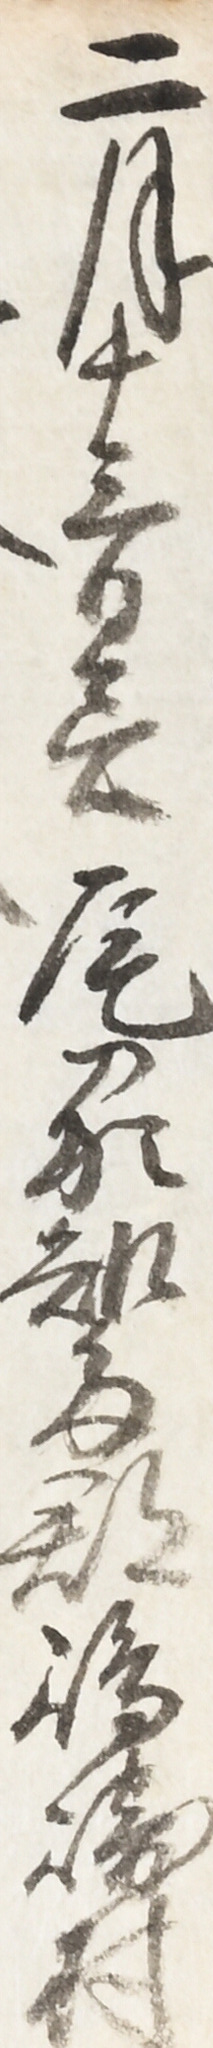二月十三日着尾州知多郡嶋崎村
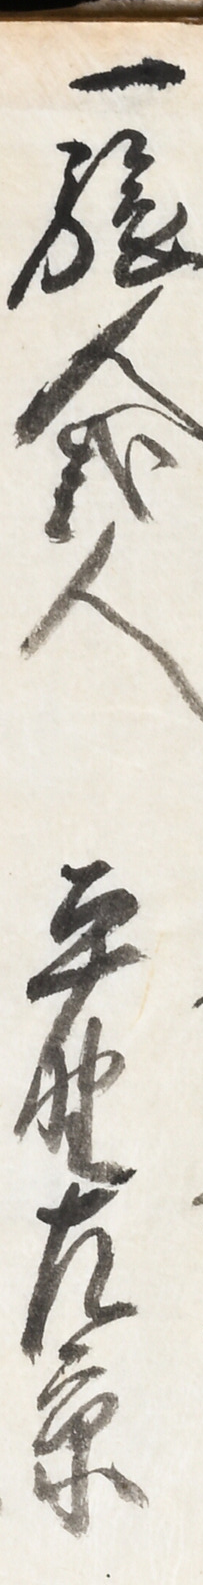一旅人弐人平野左京
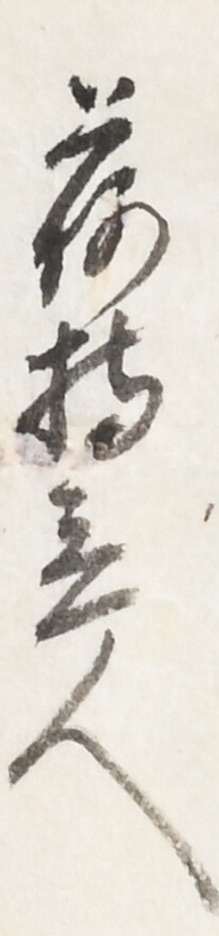荷持壱人
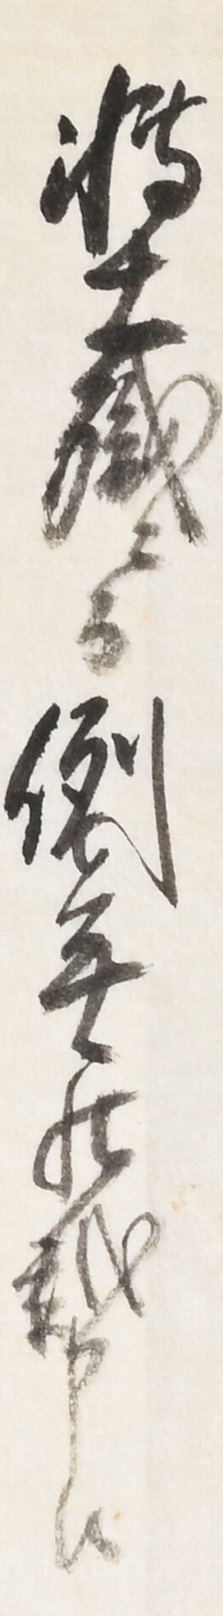転士職ニ而例年罷越申候
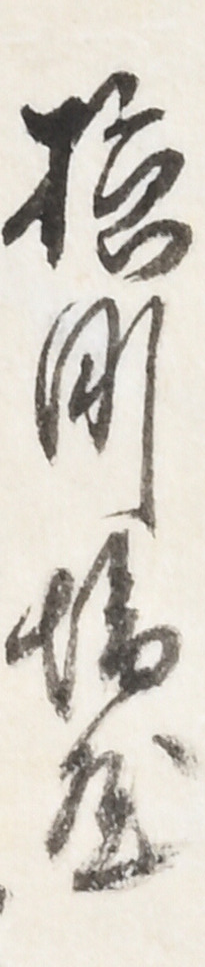横町塩屋
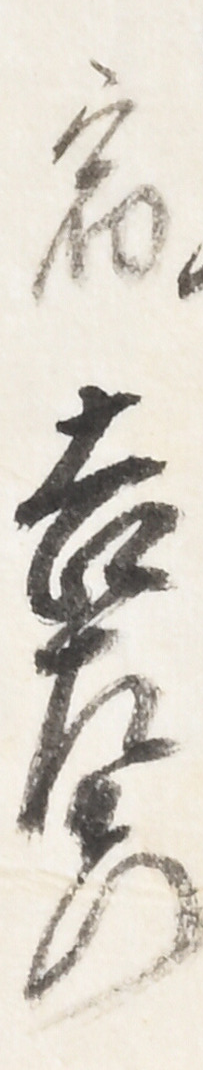宿吉左衛門
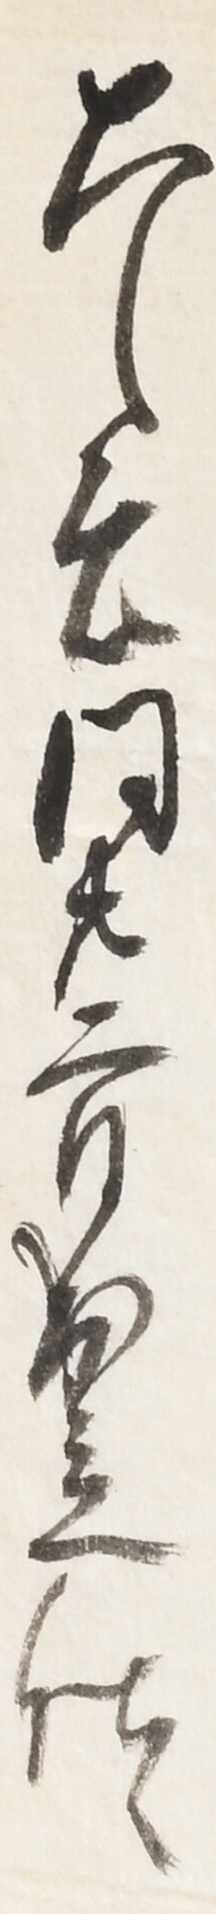右之者同廿ニ日出立仕候
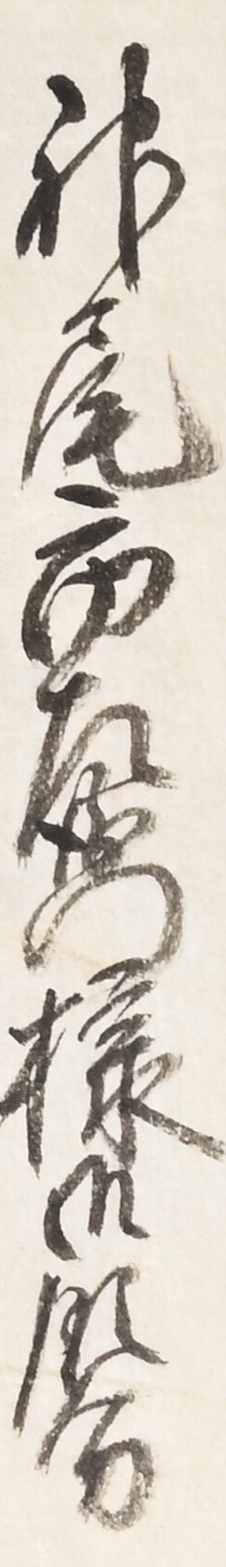神尾市左衛門様御領分
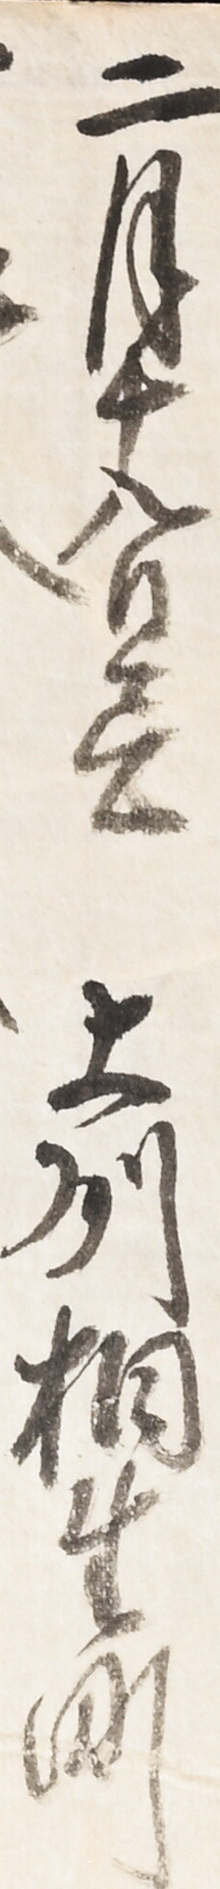二月十八日着上州桐生町
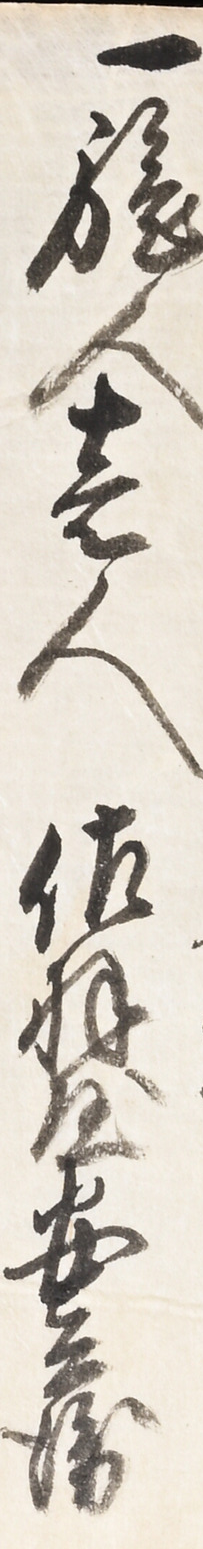一旅人壱人佐羽屋安兵衛
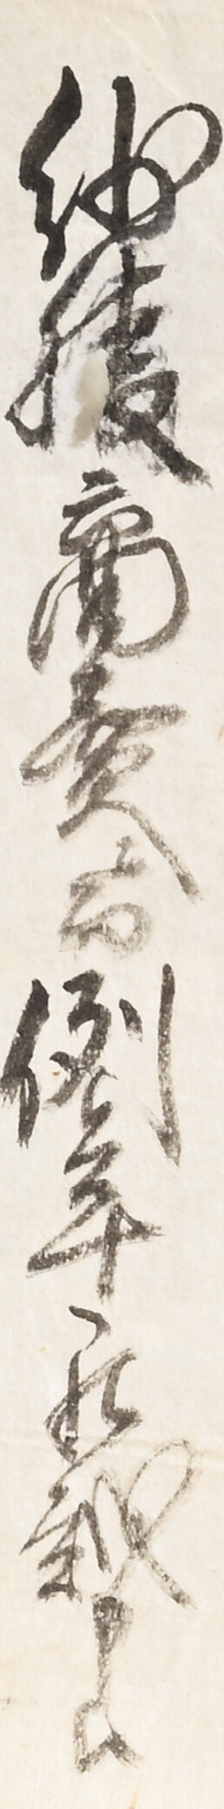紗服商売ニ而例年罷越申候
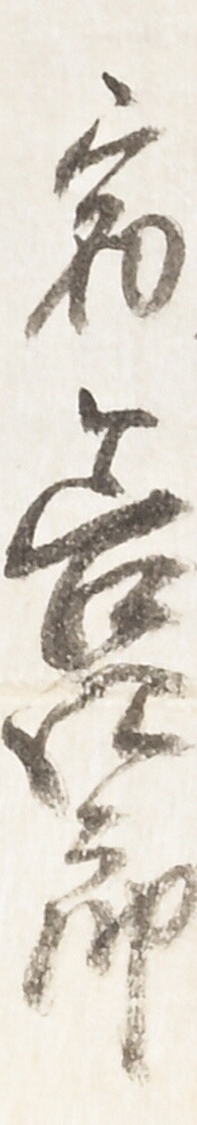宿善四郎
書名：旅人泊控帳
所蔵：伊那市立高遠町図書館・合同会社AMANE
